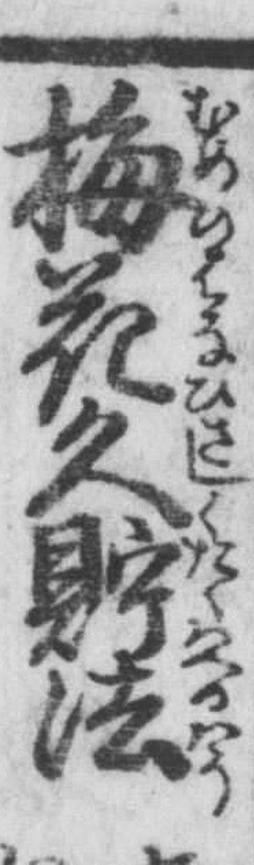梅花久貯法
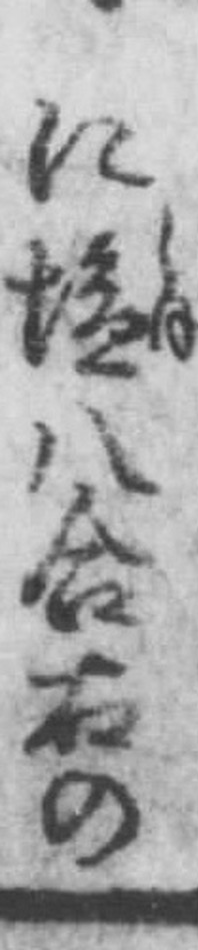に塩八合右の
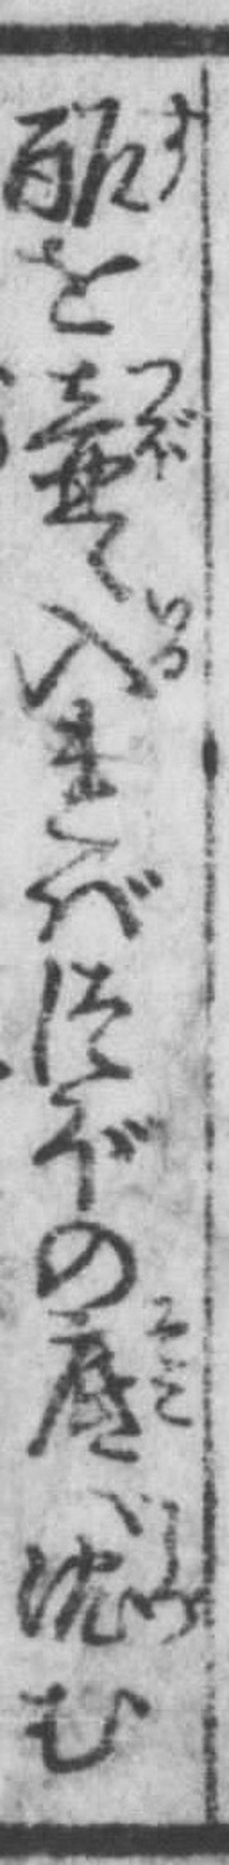酢を壷へ入れバつぼの底へ沈む
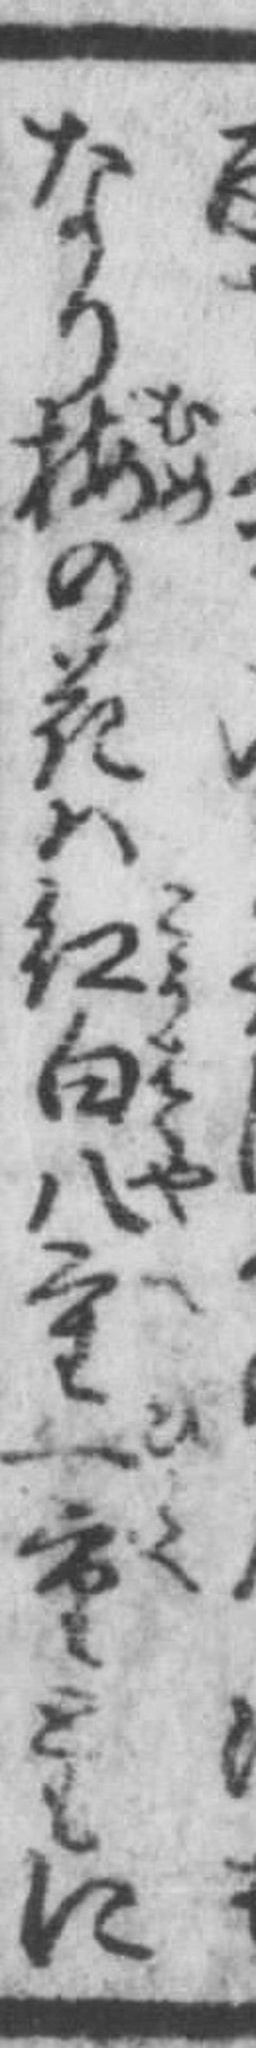なり梅の花ハ紅白八重一重ともに
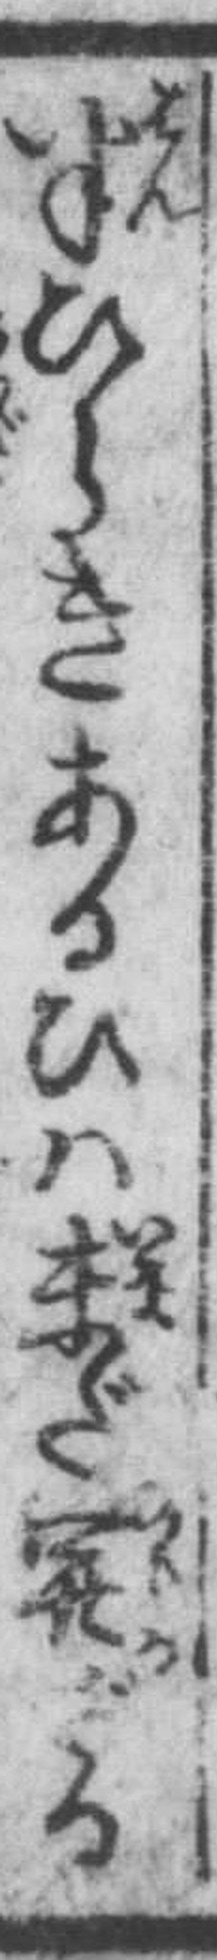半ひらきあるひハ未だ咲ざる
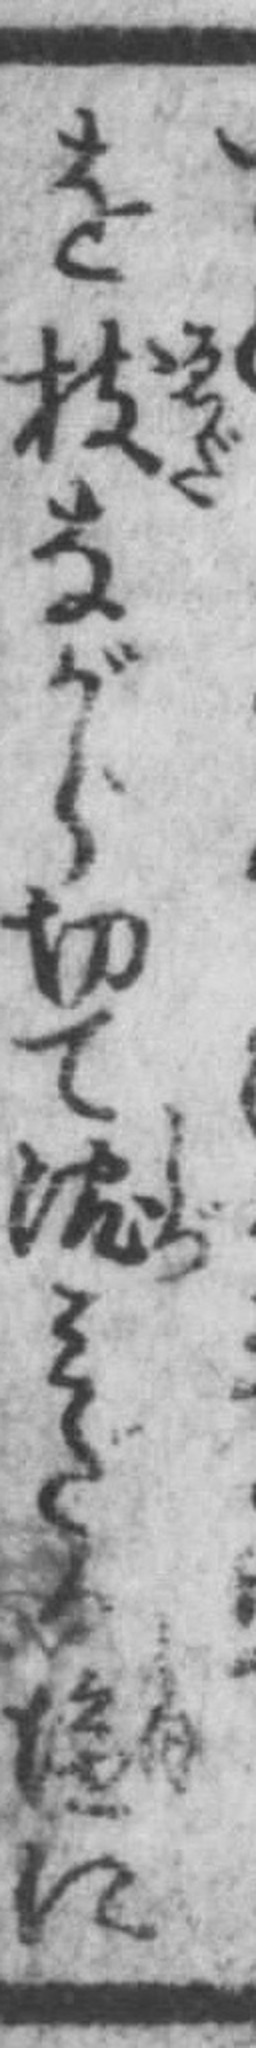を枝ながら切て沈みたるに

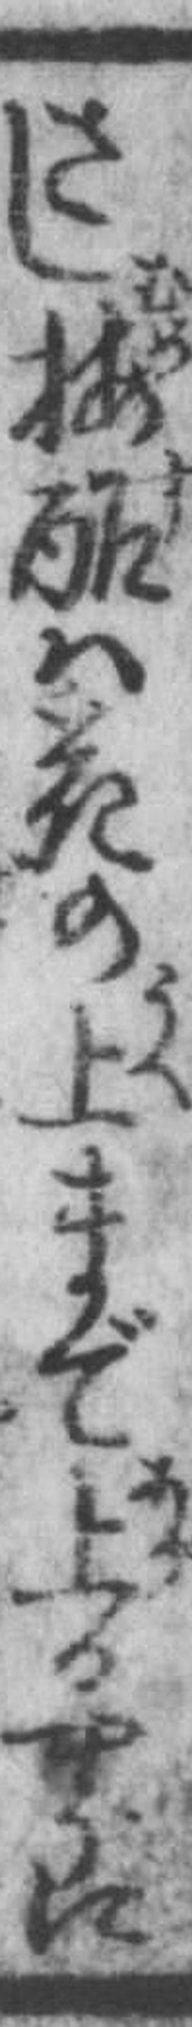さし梅酢ハ鼻の上まで上るやうに
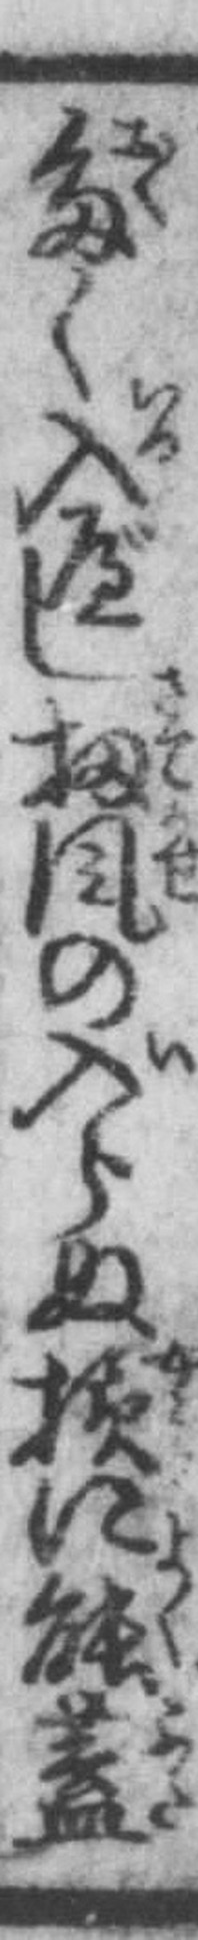置々入べし風の入らうように能蓋
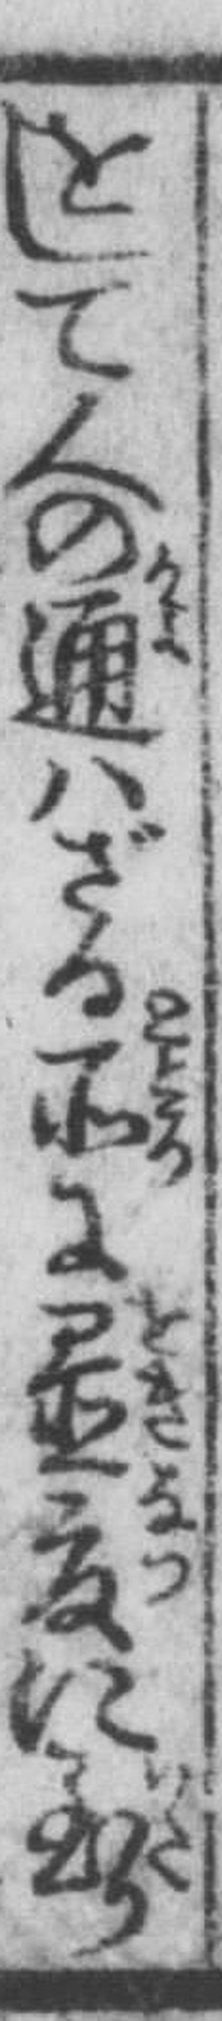をして人の通るハざる所に置き夏に出
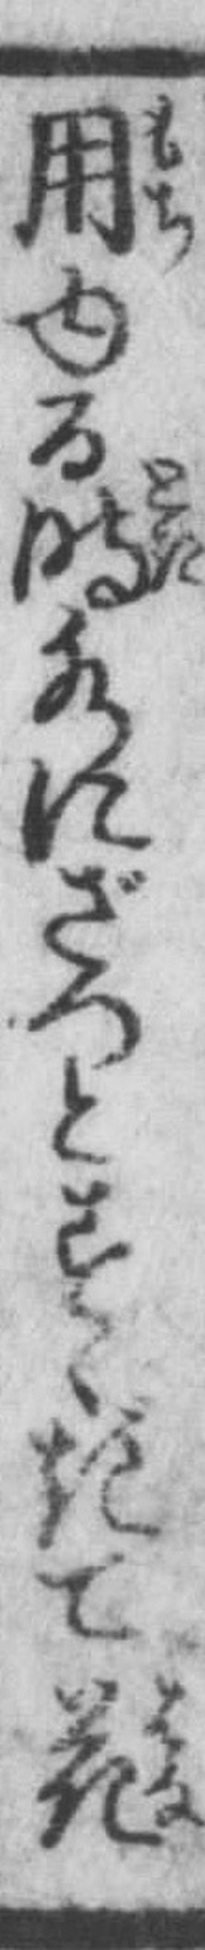用ゆる時水にざつとすゝぎて花
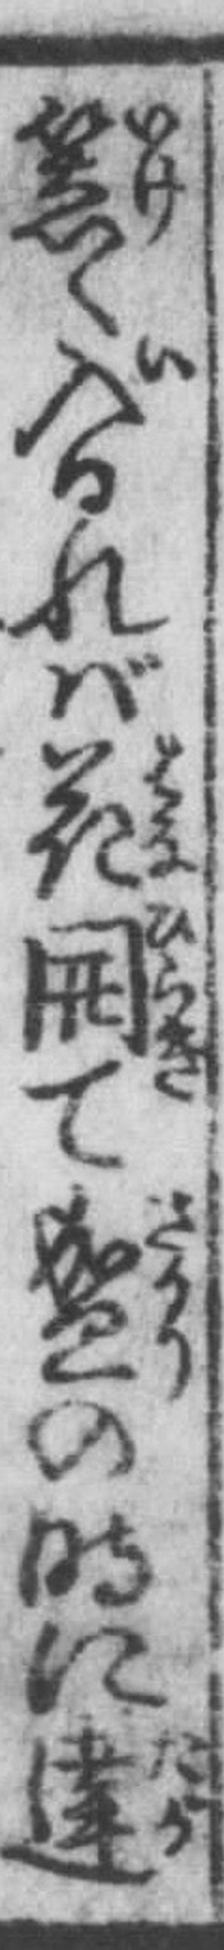生て入れバ花開て盛の時に違
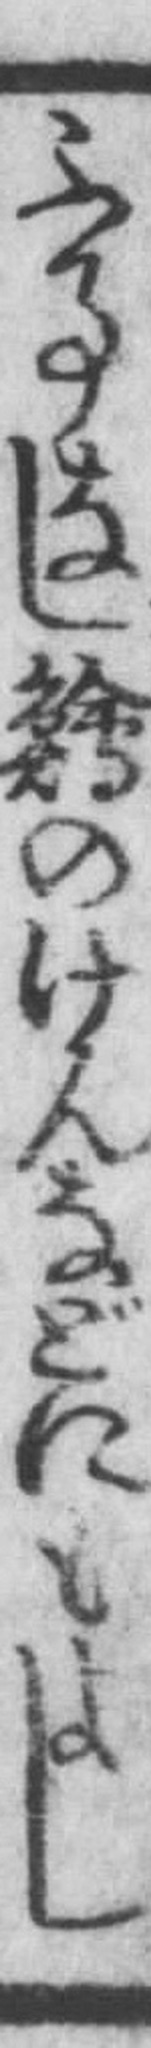ふるなし鱠のけんなどによし
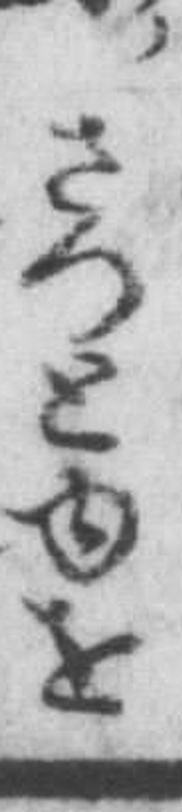さつとゆを
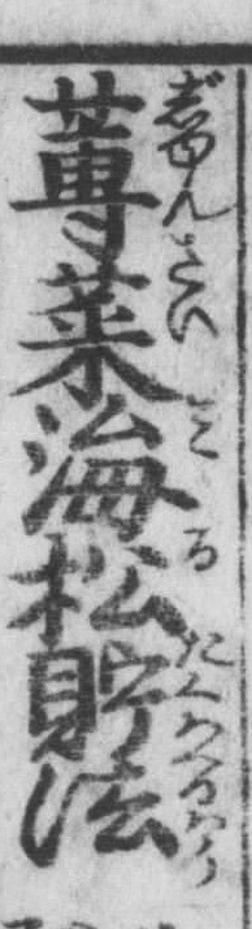蒪菜海松貯法
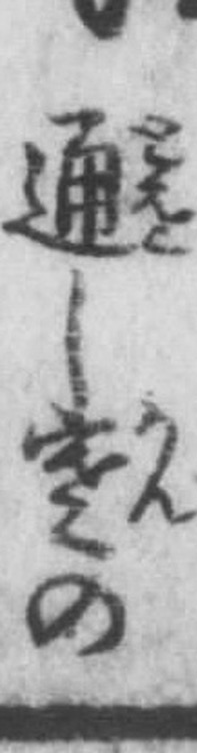遠し寒の
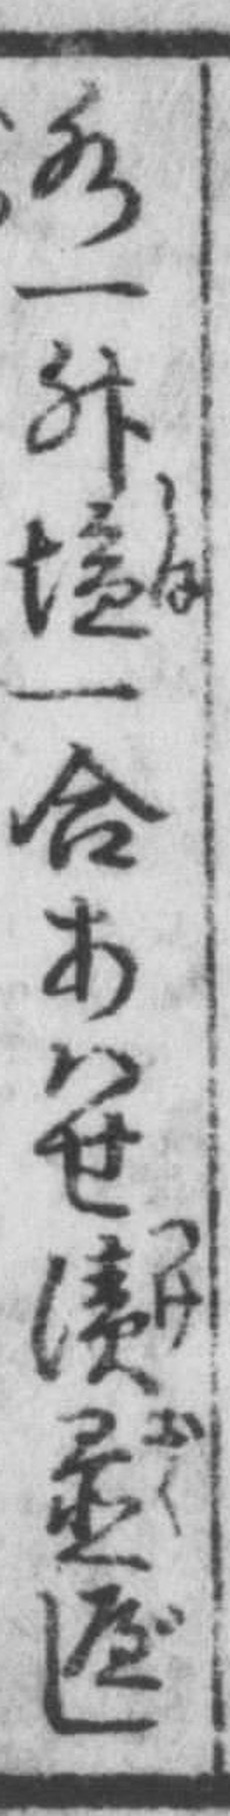水一升塩一合あハせ漬置べ也
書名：当世料理筌
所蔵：大阪府立大学学術情報センター 国文学研究資料館
